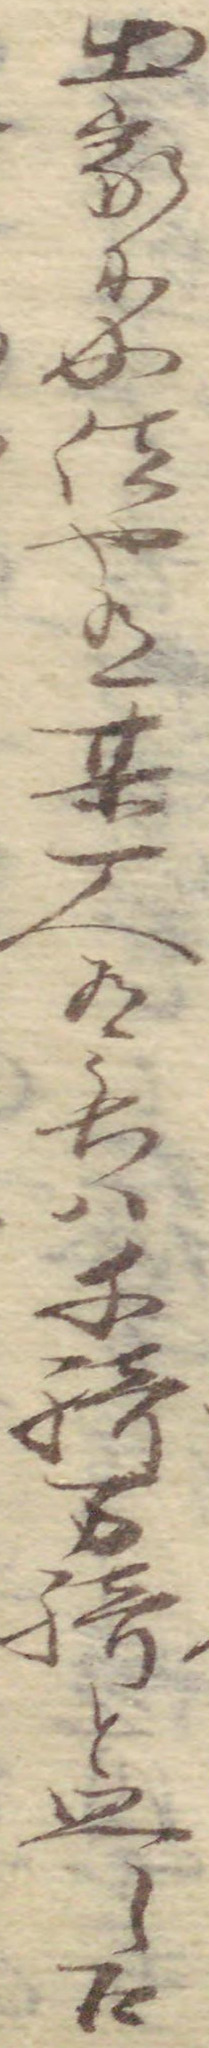出家に成法や有某一人有うちは千騎万騎と思し召
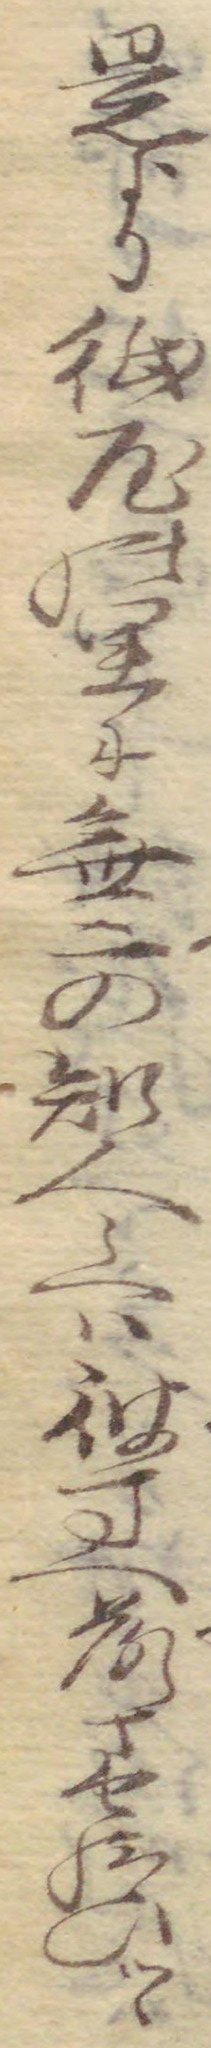是より紙屋の里に無二の知人候へは彼方へ落させ給ひつゝ

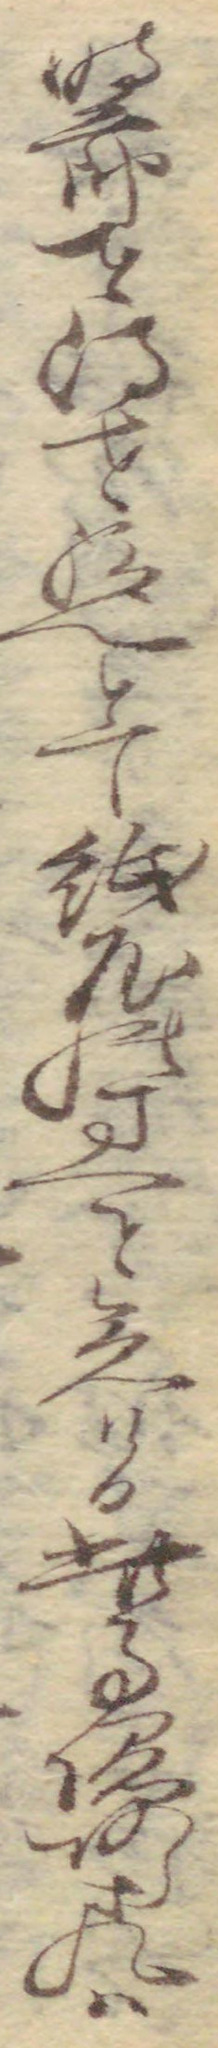時節を待せ給へとて紙屋の方へそ急ける此事隠あらされは
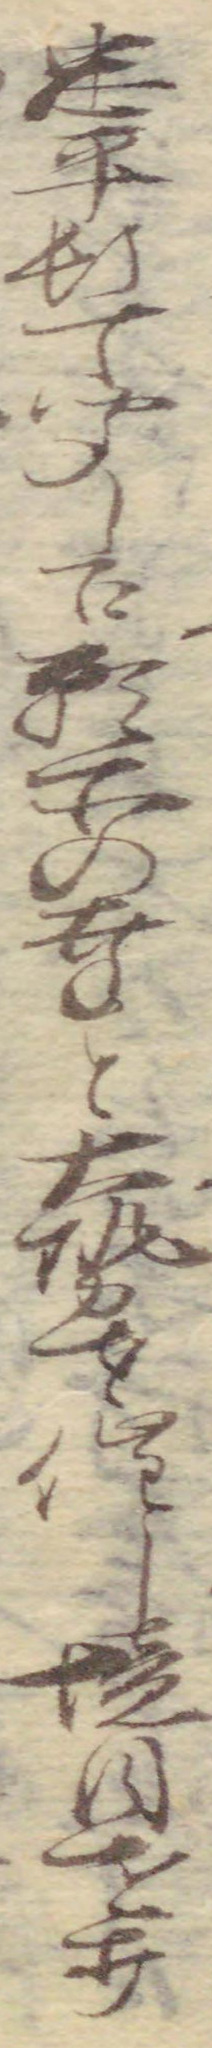忠平頓て聞し召願所の幸と大勢を催し境目を打
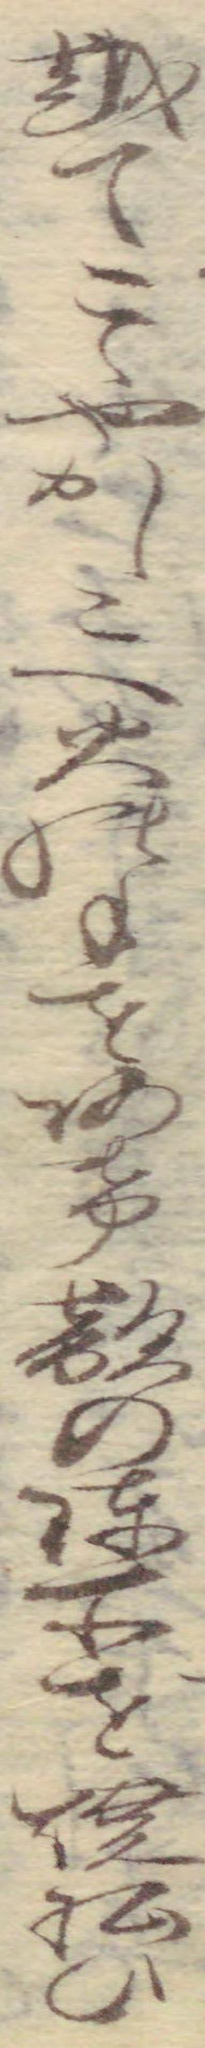越てこゝやかしこへ火の手をあけ敵の陣所を焼払ひ
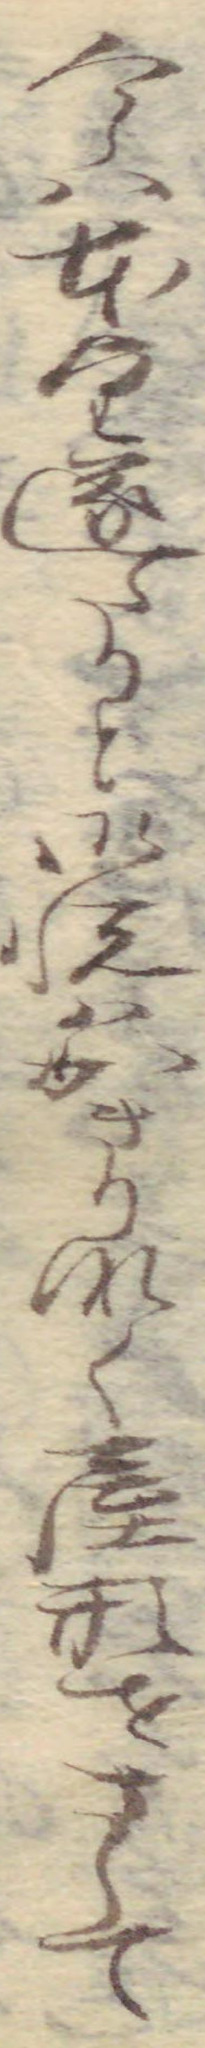今は本望遂たりと御悦はかきりなく屋形をさして
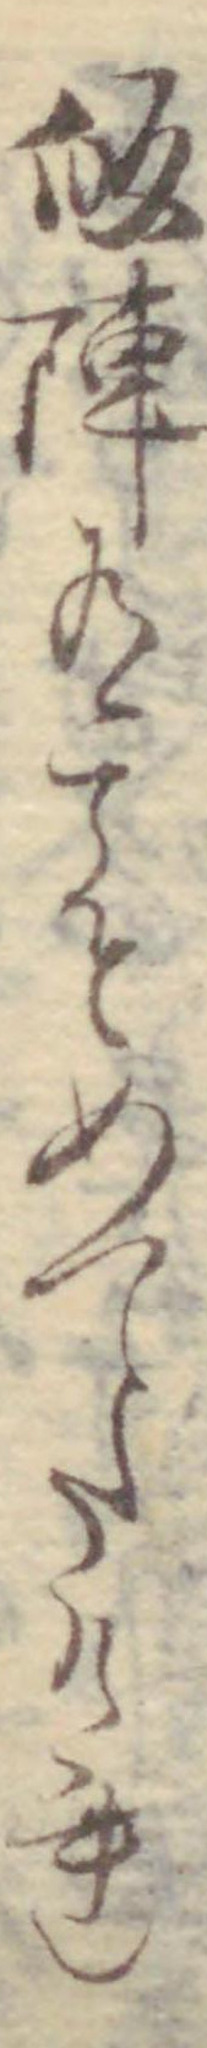帰陣有こそめてたけれ
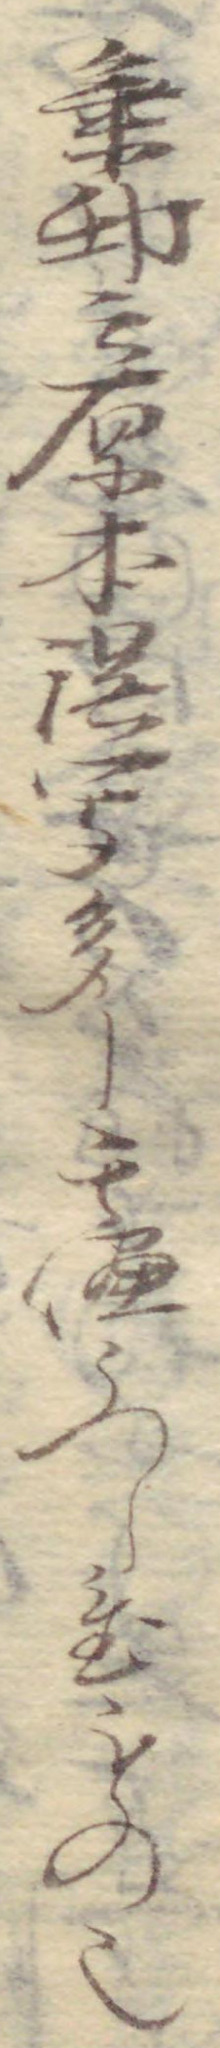乗邨云原本誤写多し其儘うつし置もの也
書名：鶯宿雑記. 巻199-200
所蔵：国立国会図書館 National Diet Library, JAPAN
